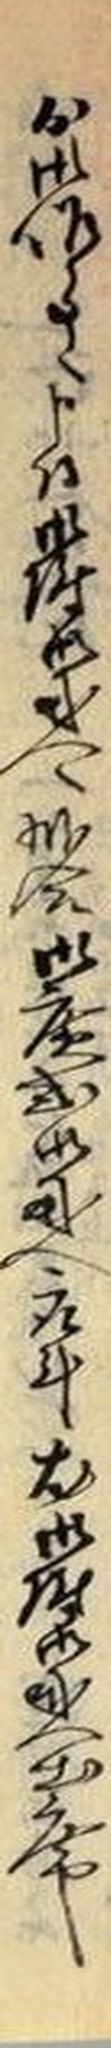ゟ御作事へ申付御附御用人へ掛合御広式御用人取計尤御附御用人出席
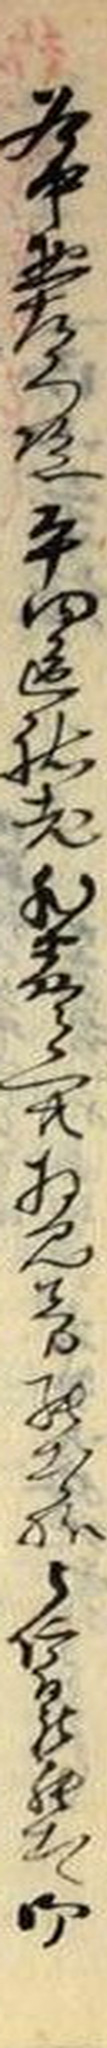谷中惣左衛門殿平田道祐老非番ニ候へ共拝見旁罷出候様被仰付被罷出候御
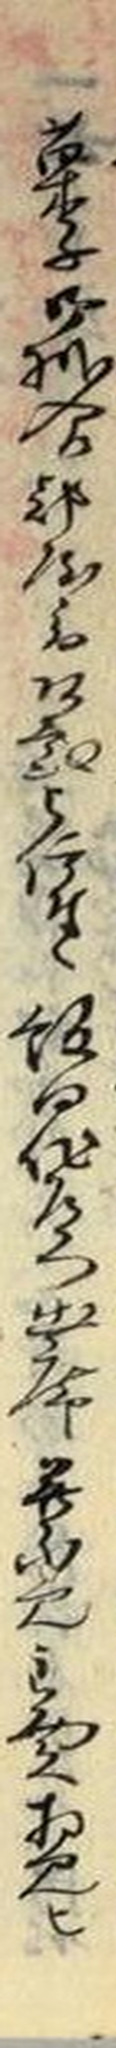菓子御掛合部屋ニ而頂戴被仰付候飯田作左衛門出席并永見主殿拝見被
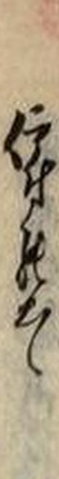仰付罷出候
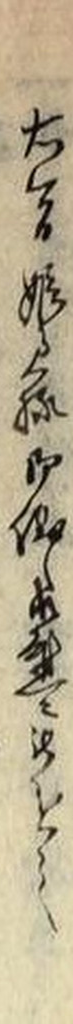右今日姫君様御側へ御慰ニ被進之
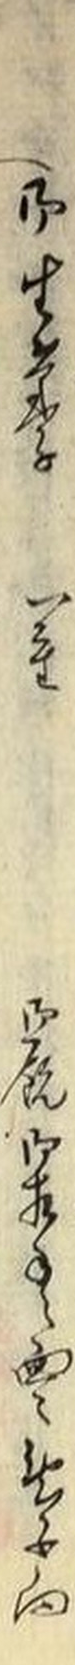御干菓子一重御厩御相手之面々台子向
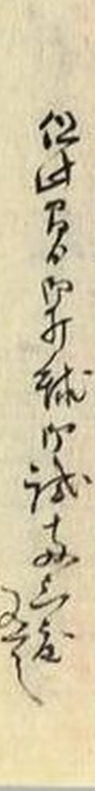但此間ゟ御打毬御試両三度
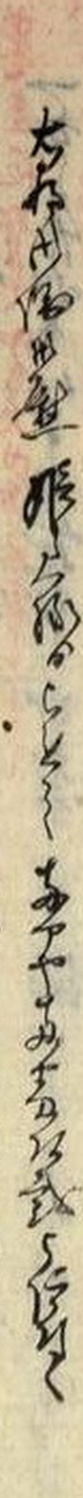右為御側御慰姫君様ゟ被進之両部や両番頂戴被仰付候
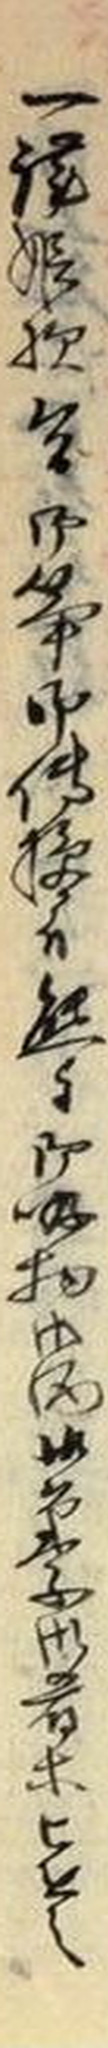一謹姫様今日御箏御伝授候ニ付態与御吸物御酒御菓子御肴等被進之

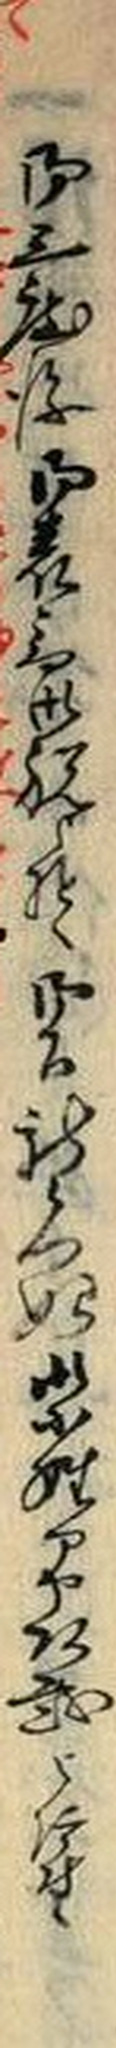御三度後御表ニ而御祝被遊候御召新右衛門始御小姓部や頂戴被仰付候
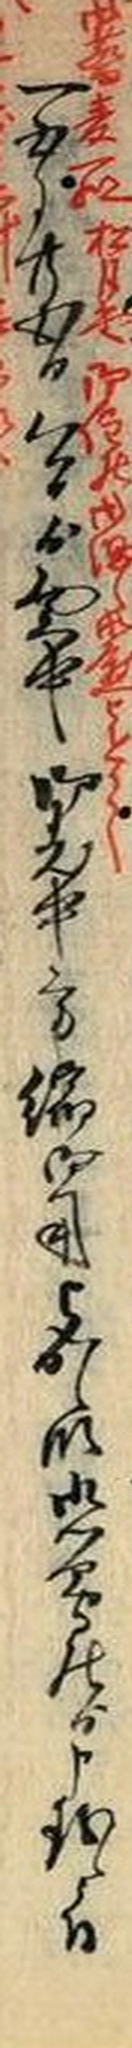一五月廿五日今日ゟ殿中御老中方縮御用被成候段御留守居ゟ申越候付
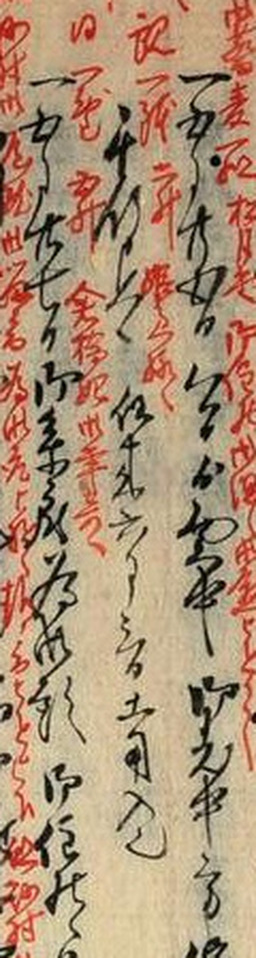其段申上候但来六月三日土用入也
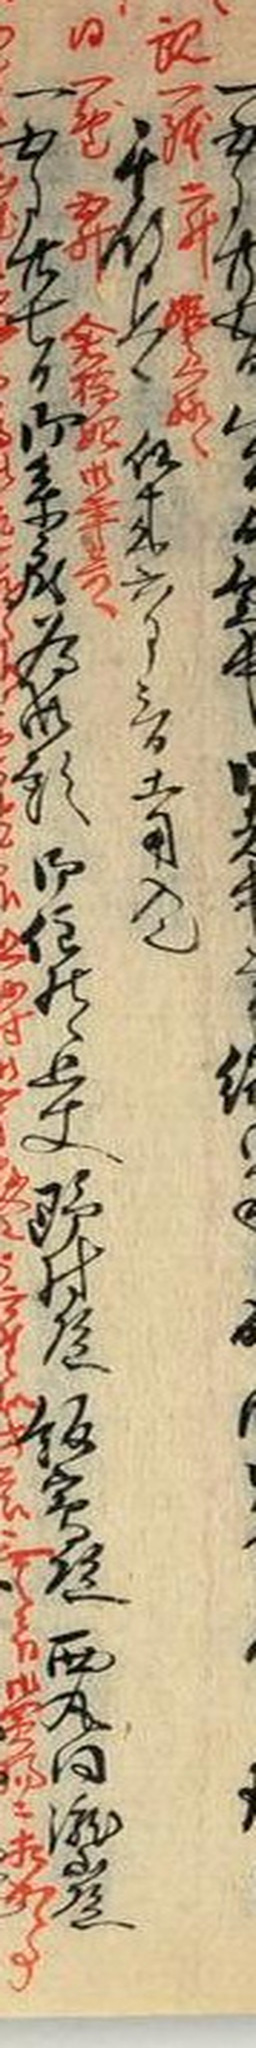一五月廿七日御参被成為御歓御住居へ上使野村殿飯岡殿西丸同瀧山殿
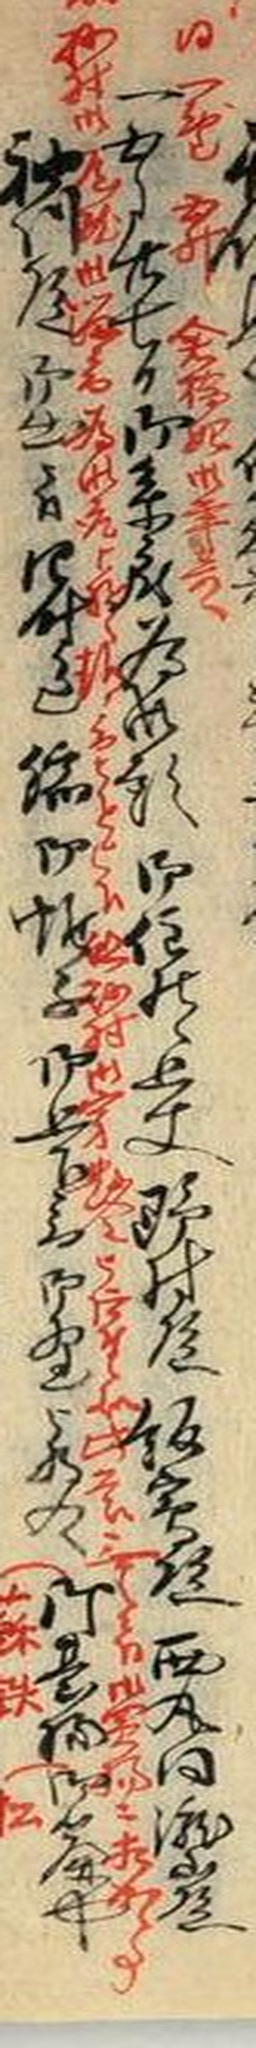神川殿御出ニ付四時過縮御帷子御上下ニ而御逢被為入候御台様御簾中
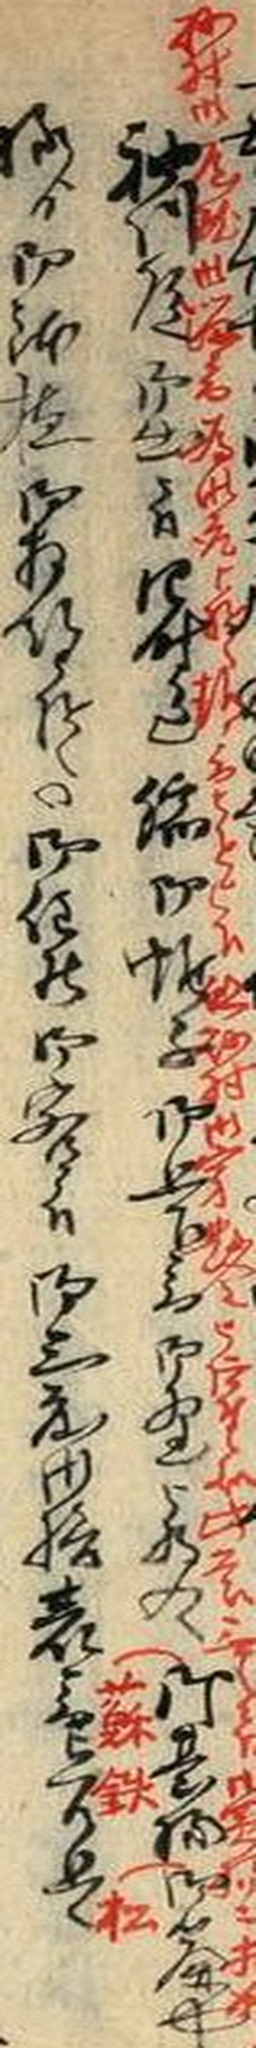様ゟ御鉢植御拝領被遊候〇御住居御客ニ付御三度御膳表ニ而被召上候
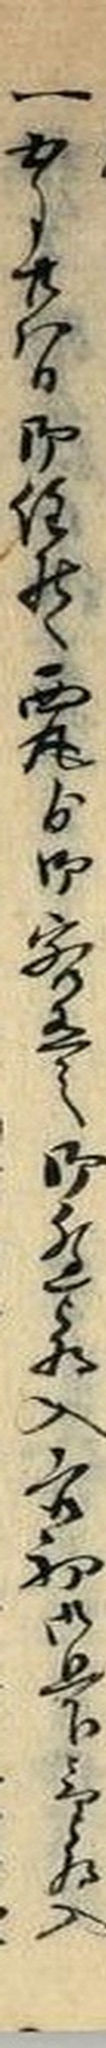一五月廿八日御住居へ西丸ゟ御客有之御逢被為入最初御上下ニ而被為入
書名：少傅日録抄（斉承付側向頭取日記、在府）
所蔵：福井県文書館 Fukui Prefectural Archives
